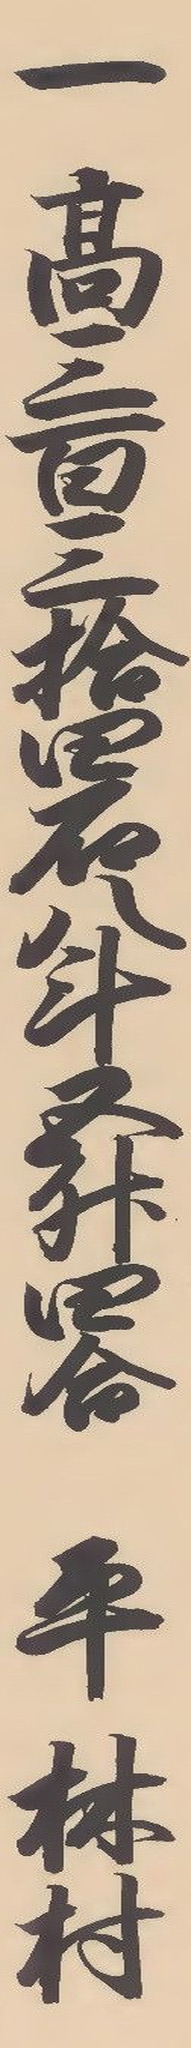一高三百三拾四石八斗五升四合平林村
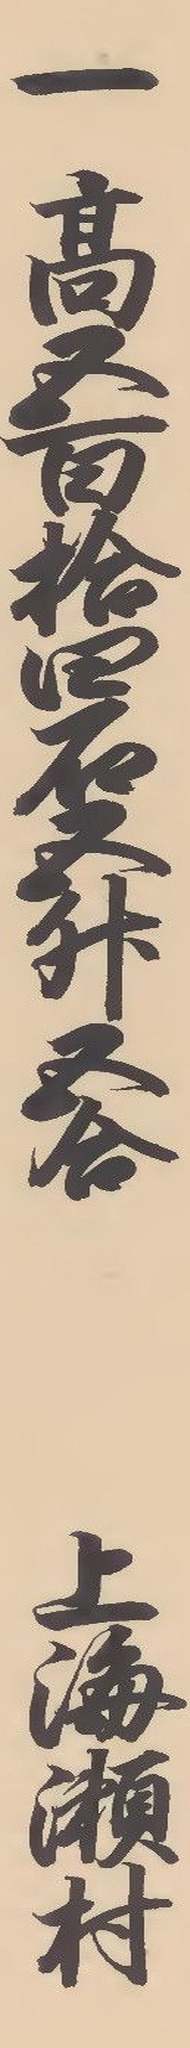一高五百拾四石五升五合上海瀬村
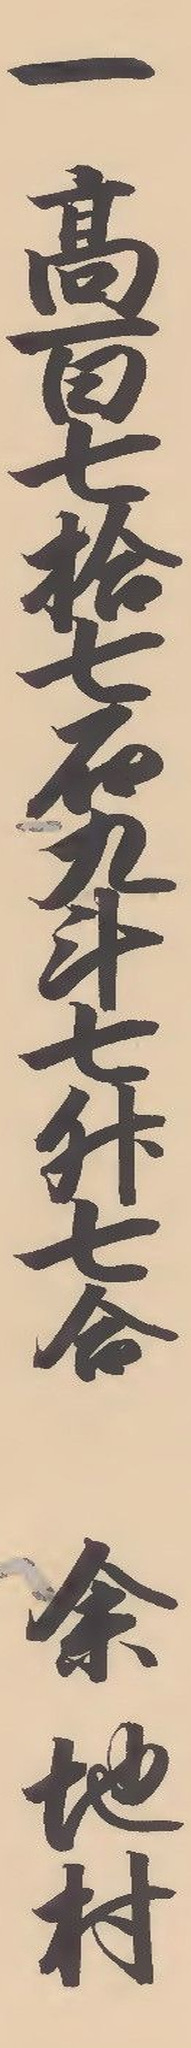一高百七拾七石九斗七升七合余地村

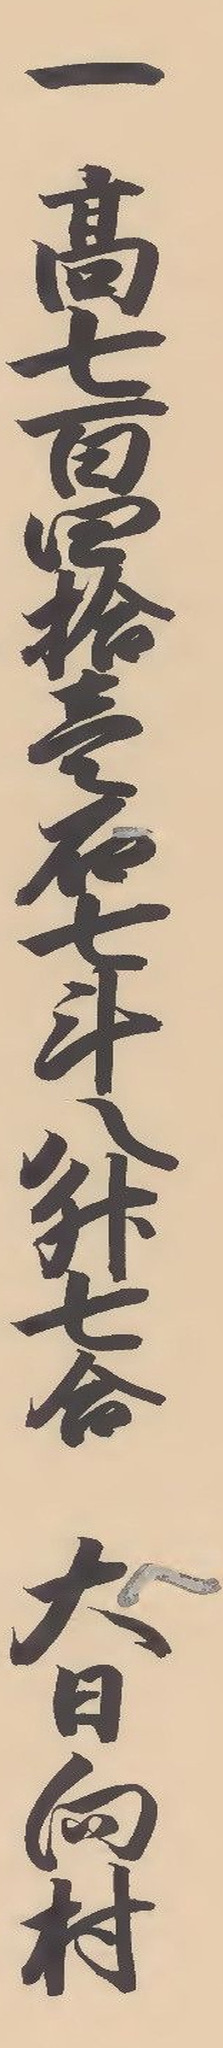一高七百四拾壱石七斗八升七合大日向村
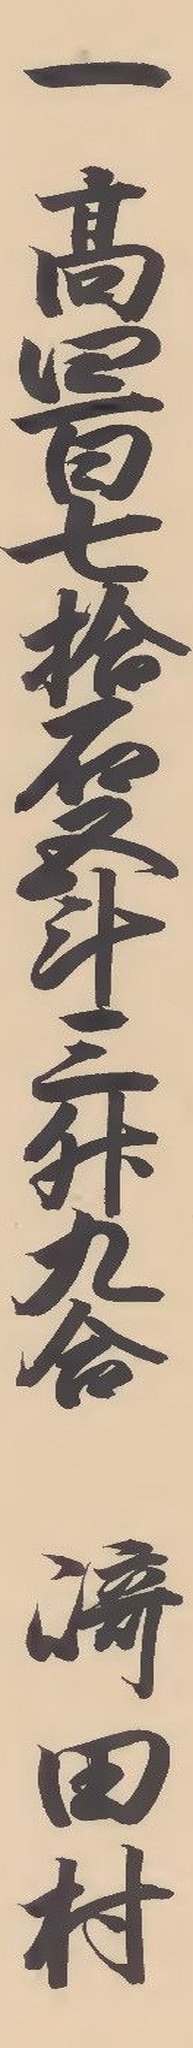一高四百七拾石五斗三升九合崎田村
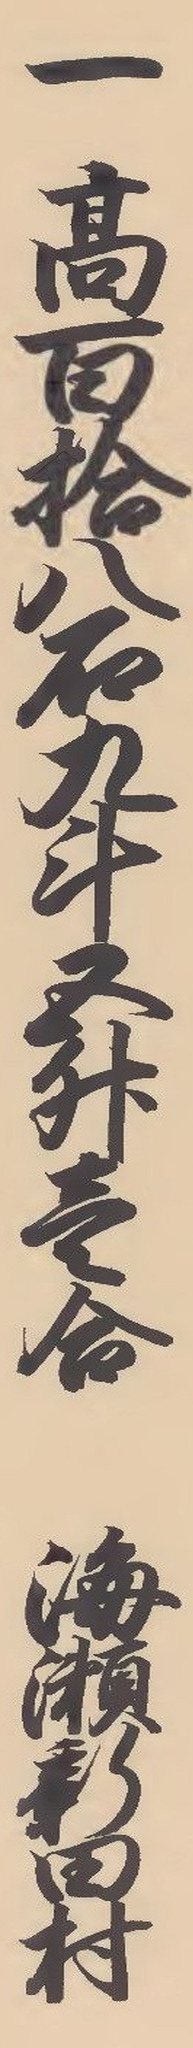一高百拾八石九斗五升壱合海瀬新田村
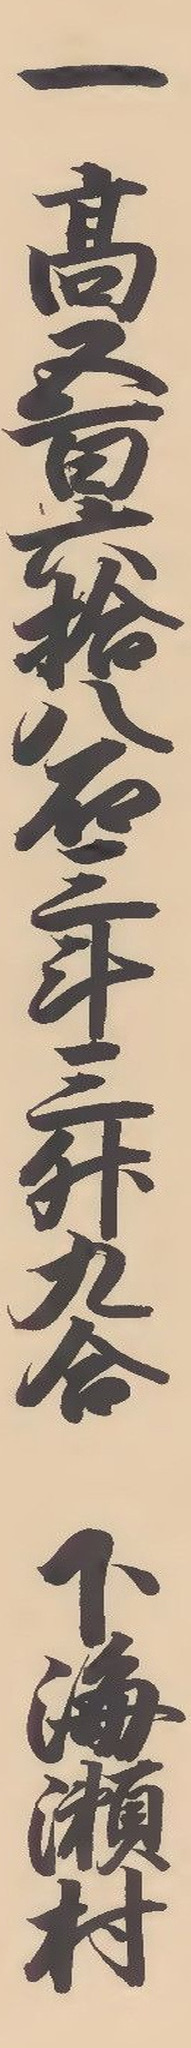一高五百六拾八石三斗三升九合下海瀬村
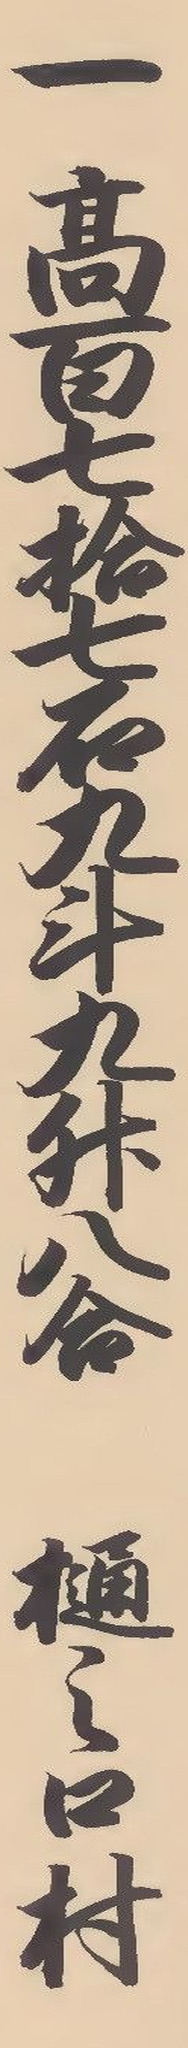一高百七拾七石九斗九升八合樋之口村
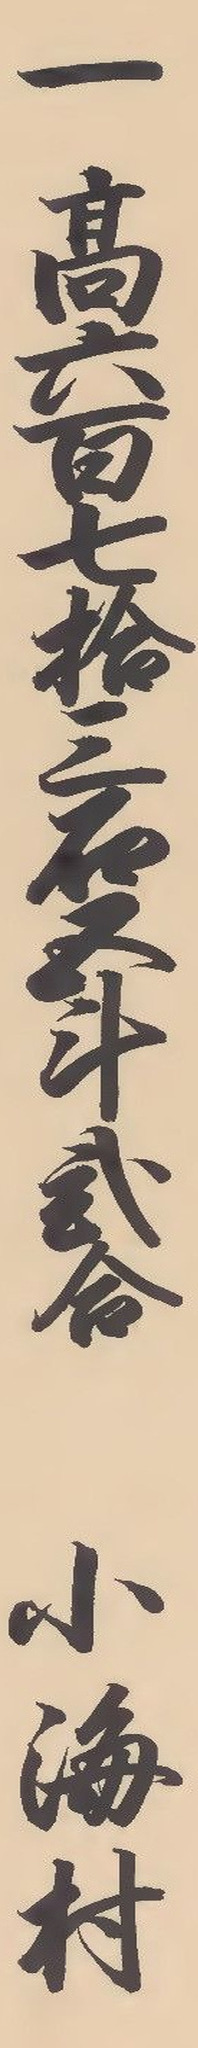一高六百七拾三石五斗弐合小海村
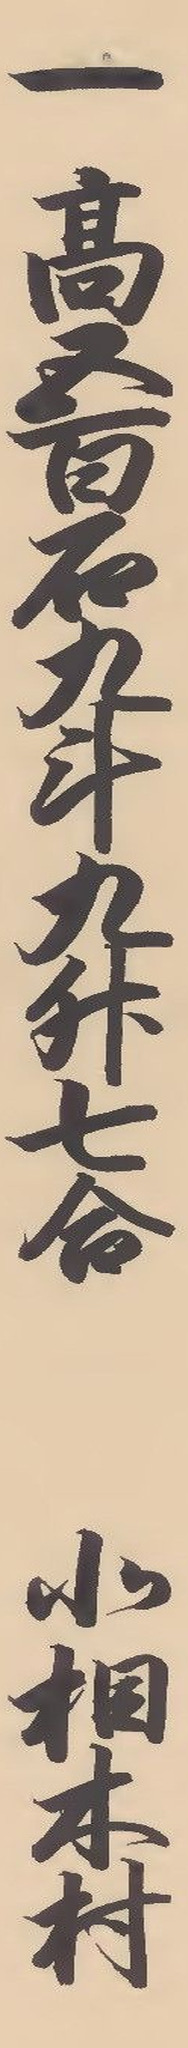一高五百石九斗九升七合北相木村
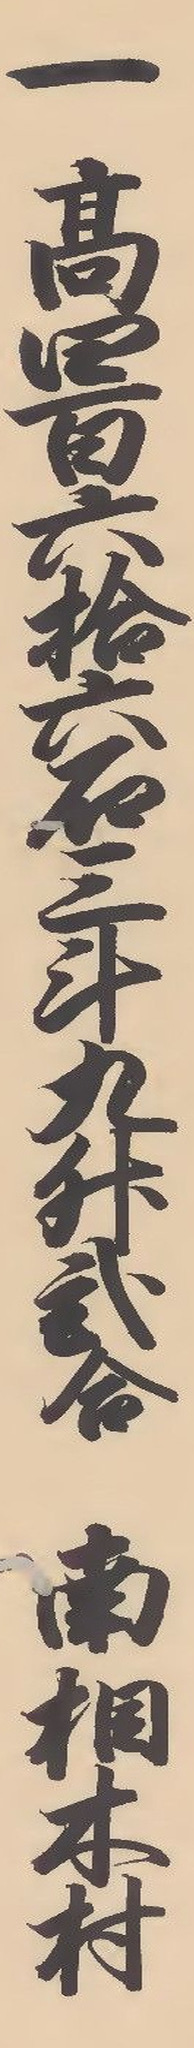一高四百六拾六石三斗九升弐合南相木村

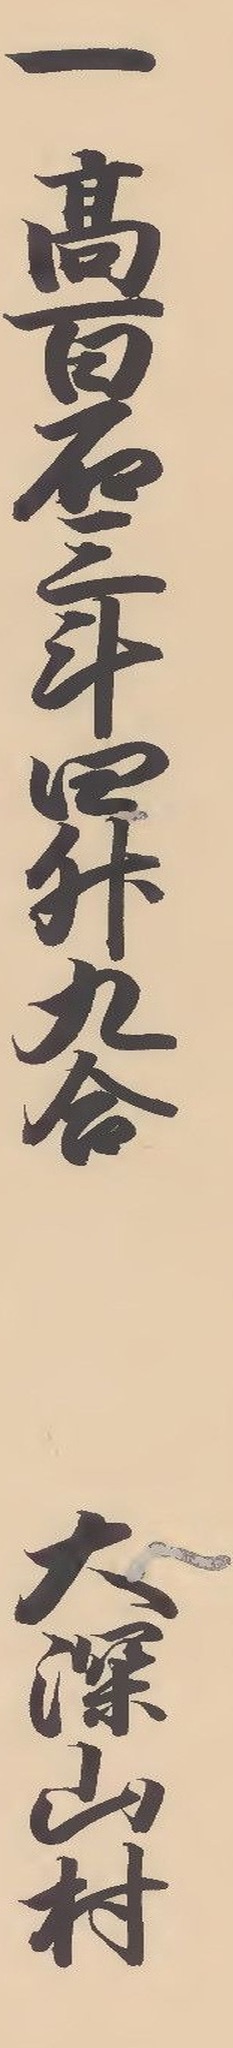一高百石三斗四升九合大深山村
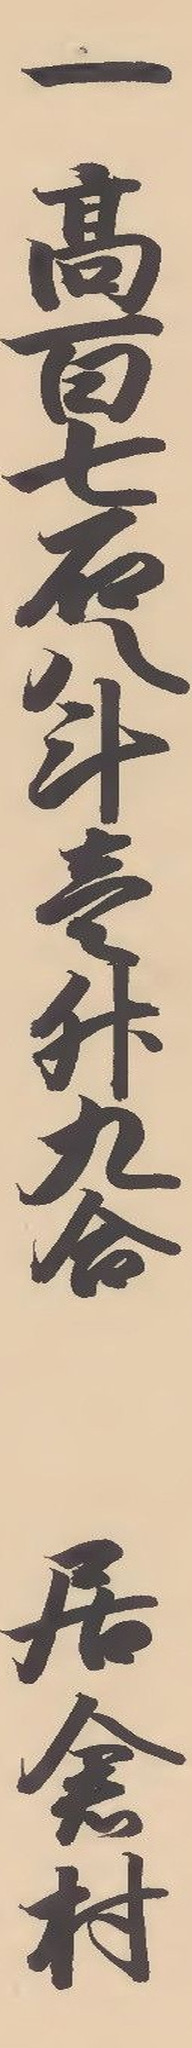一高百七石八斗壱升九合居倉村
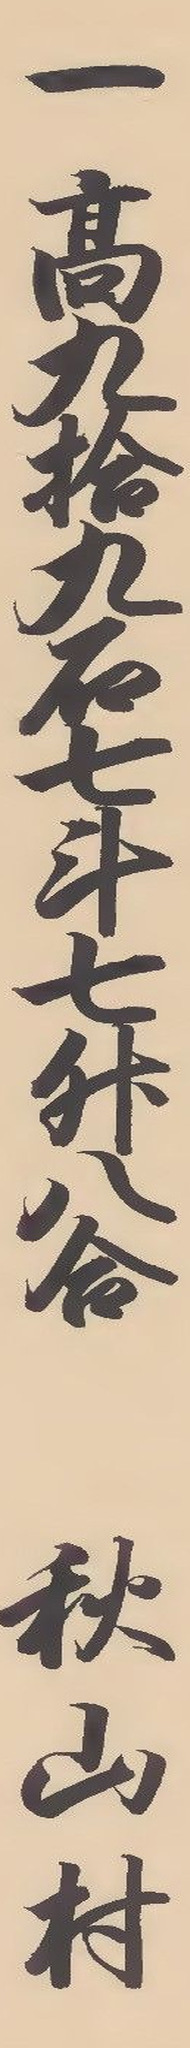一高九拾九石七斗七升八合秋山村
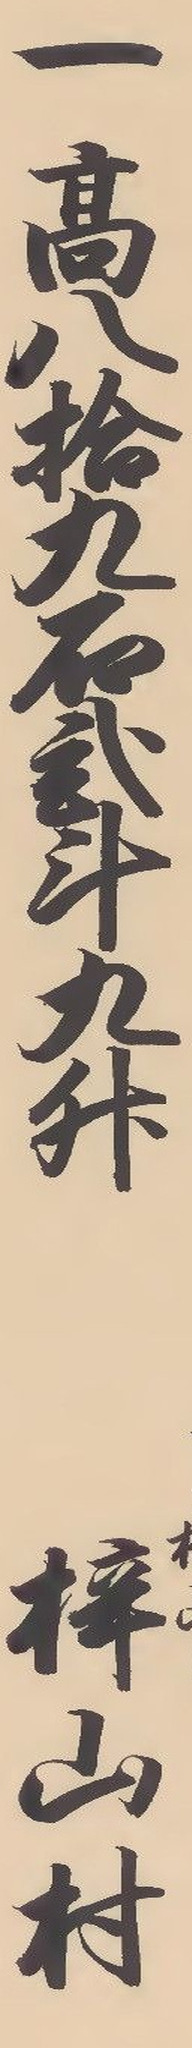一高八拾九石弐斗九升梓山村
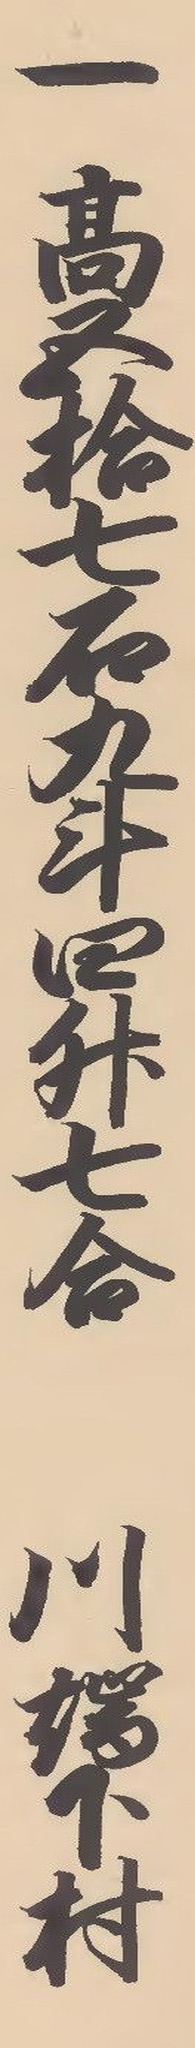一高五拾七石九斗四升七合川端下村
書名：信濃国郷帳
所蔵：国立公文書館 National Archives of Japan
